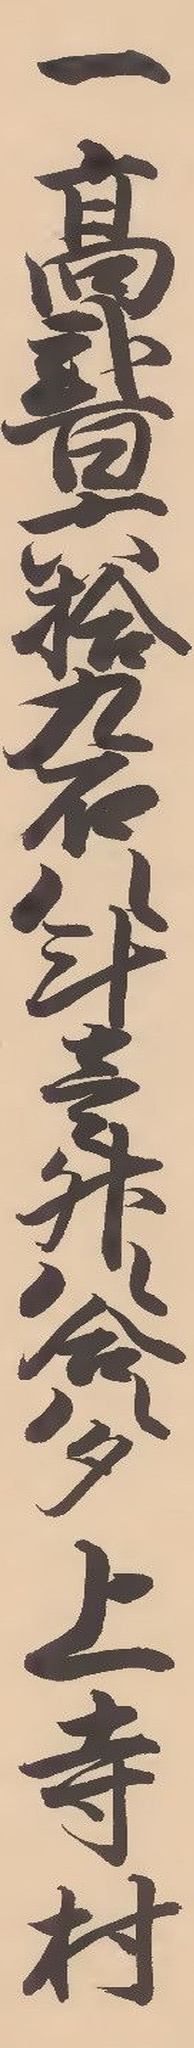一高弐百六拾九石八斗壱升八合八勺上寺村
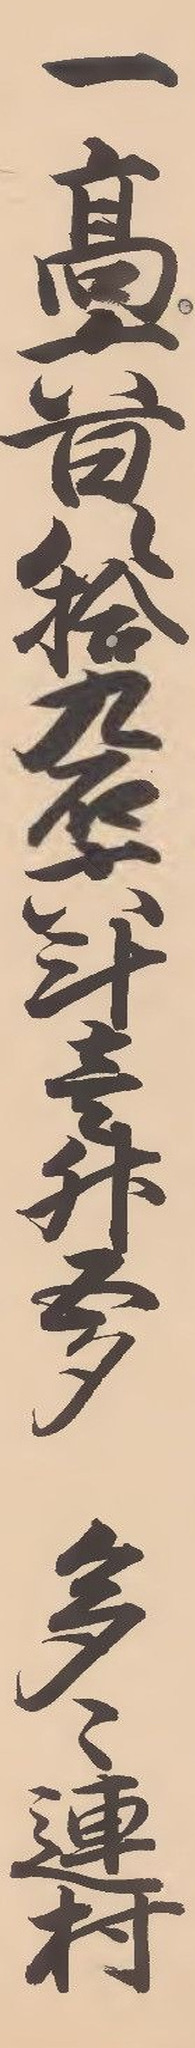一高六百八拾九石六斗壱升五勺多々連村
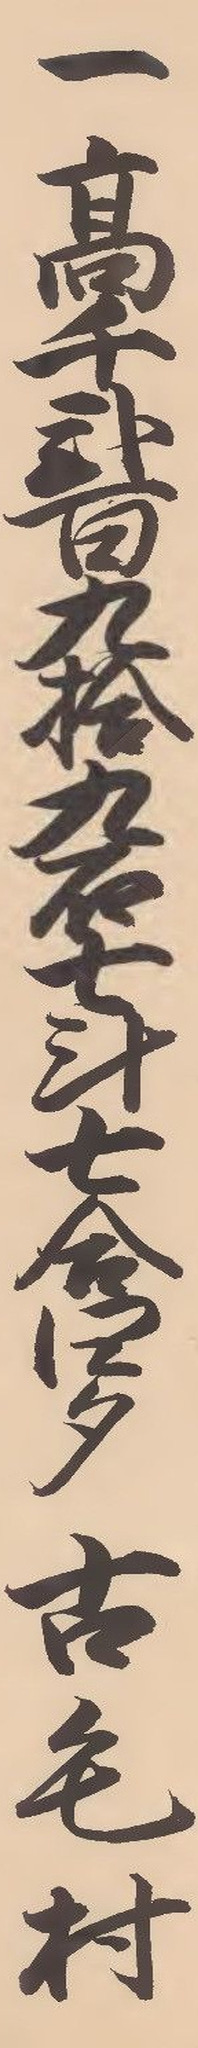一高千弐百九拾九石七斗七合四勺古毛村
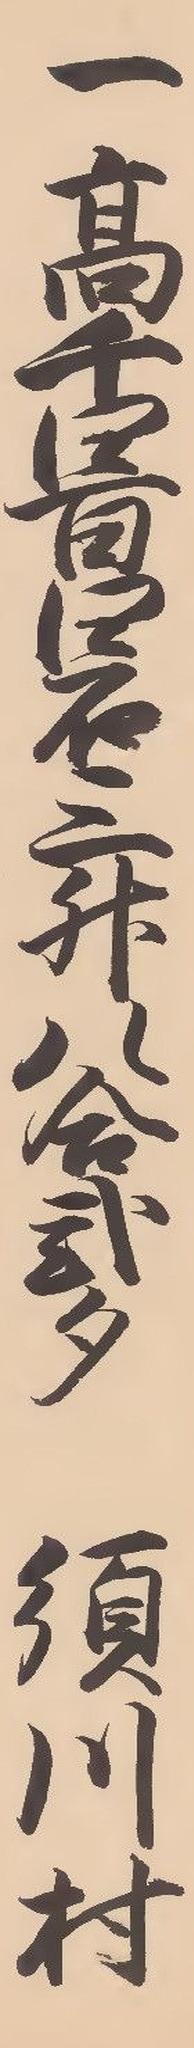一高千四百四石三升八合弐勺須川村
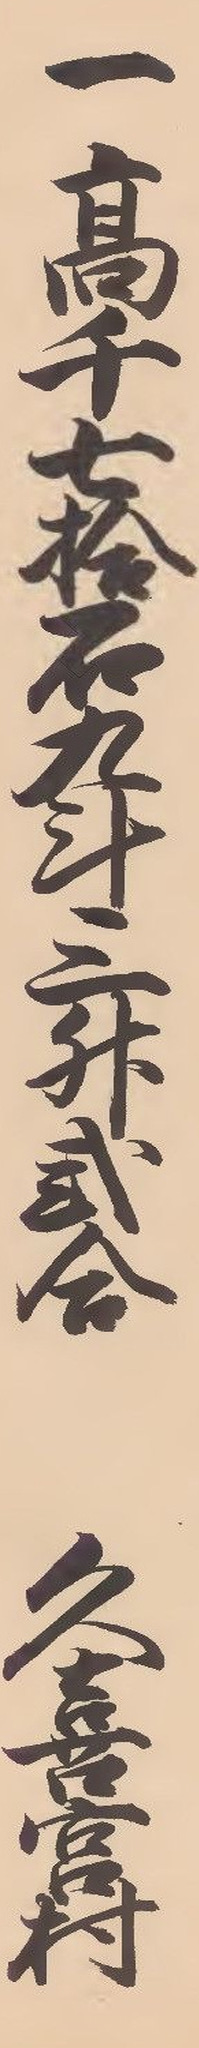一高千七拾石九斗三升弐合久喜宮村

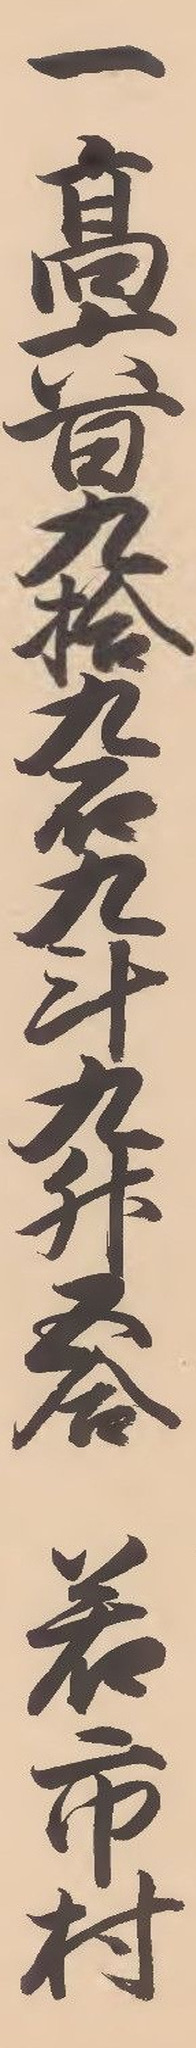一高六百九拾九石九斗九升五合若市村
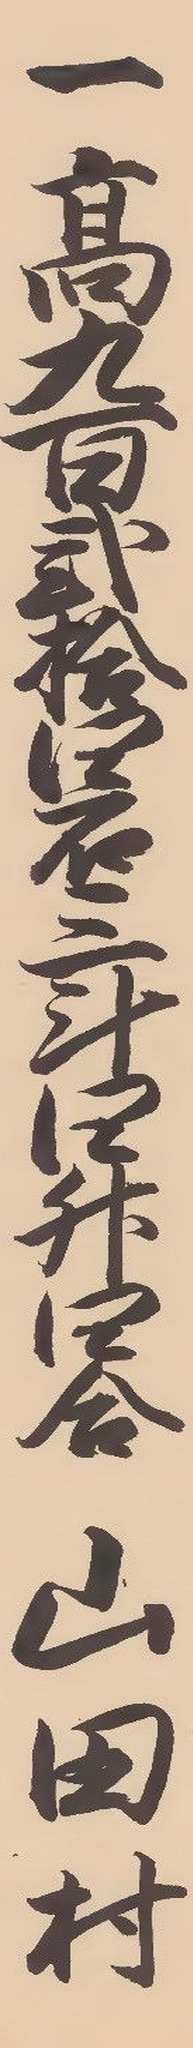一高九百弐拾四石三斗四升四合山田村
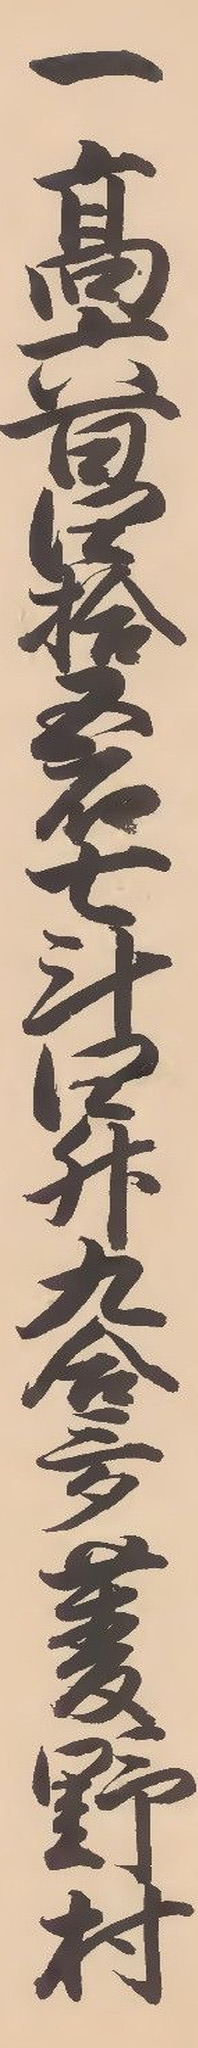一高六百四拾五石七斗四升九合三勺菱野村
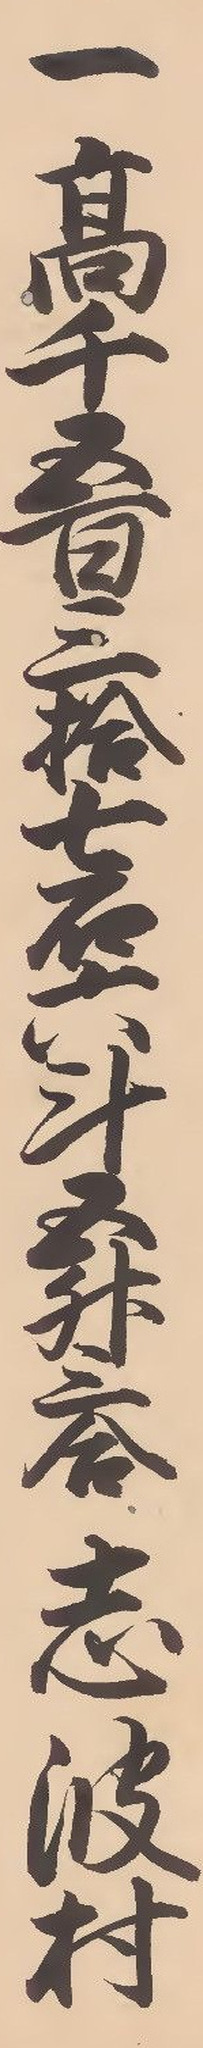一高千五百三拾七石六斗五升三合志波村
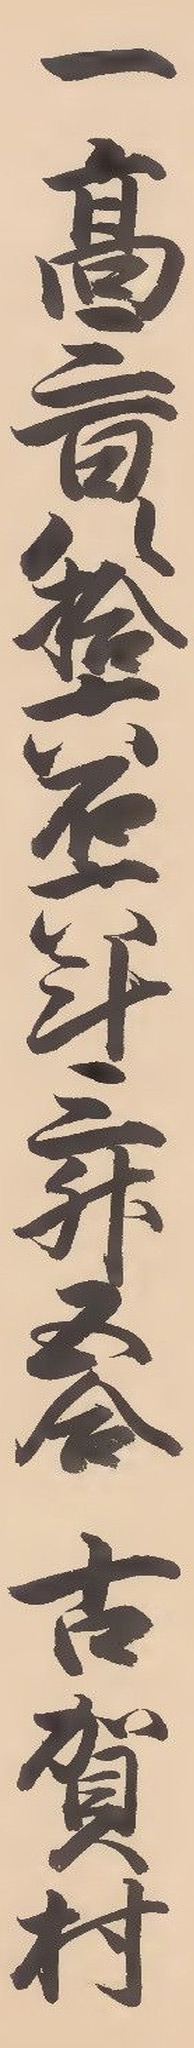一高三百八拾六石六斗三升五合古賀村
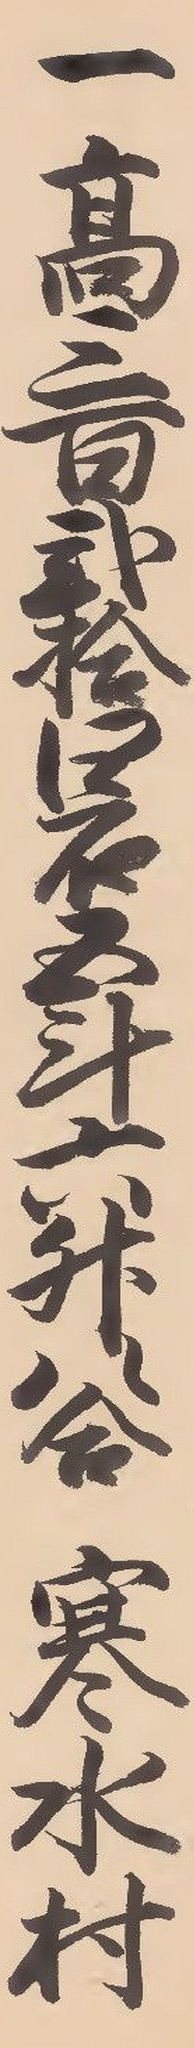一高三百弐拾四石五斗六升八合寒水村
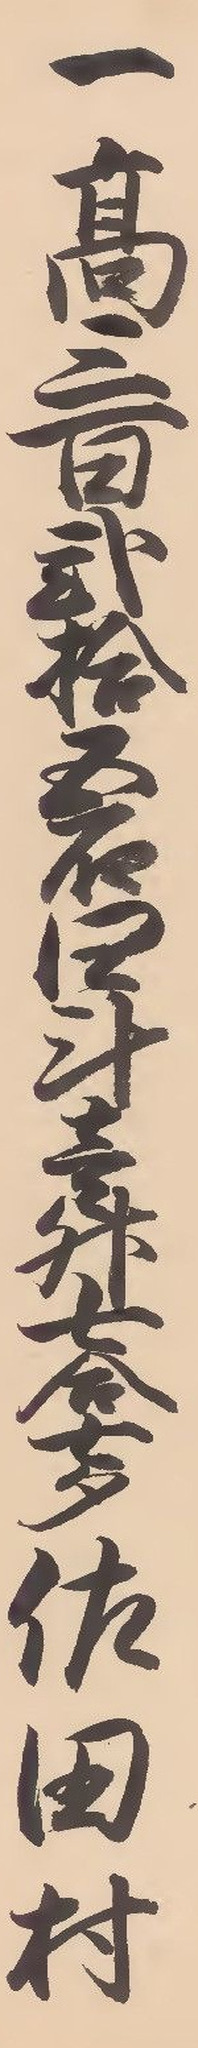一高三百弐拾五石四斗壱升七合七勺佐田村

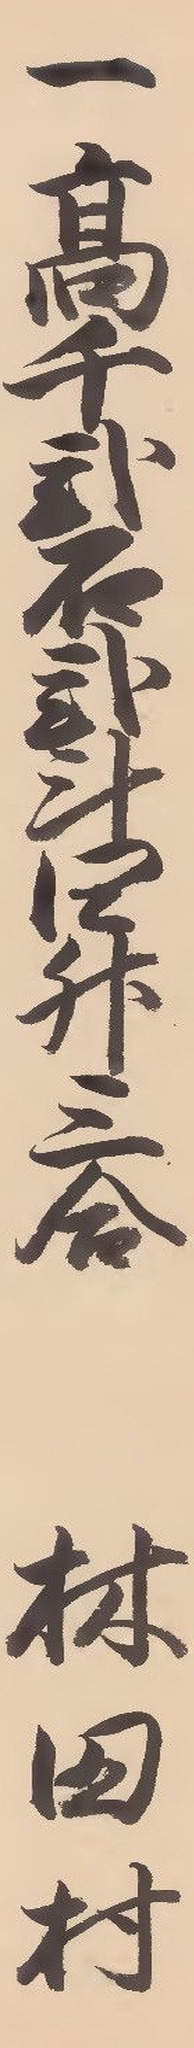一高千弐石弐斗四升三合林田村
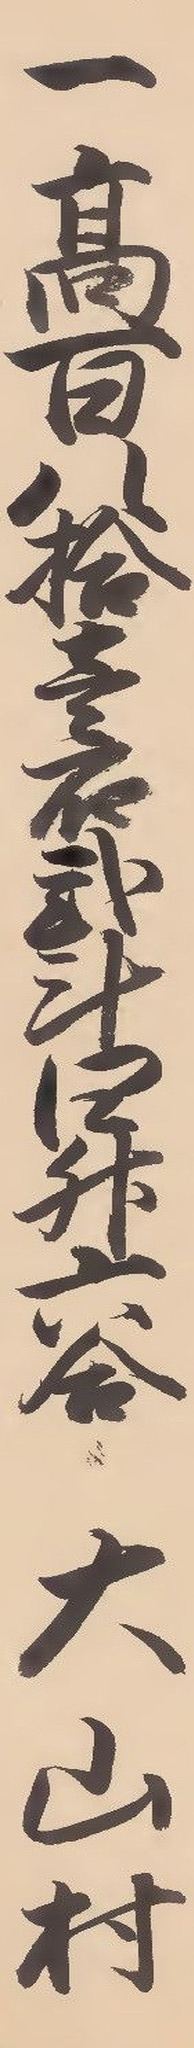一高百八拾壱石弐斗四升六合大山村
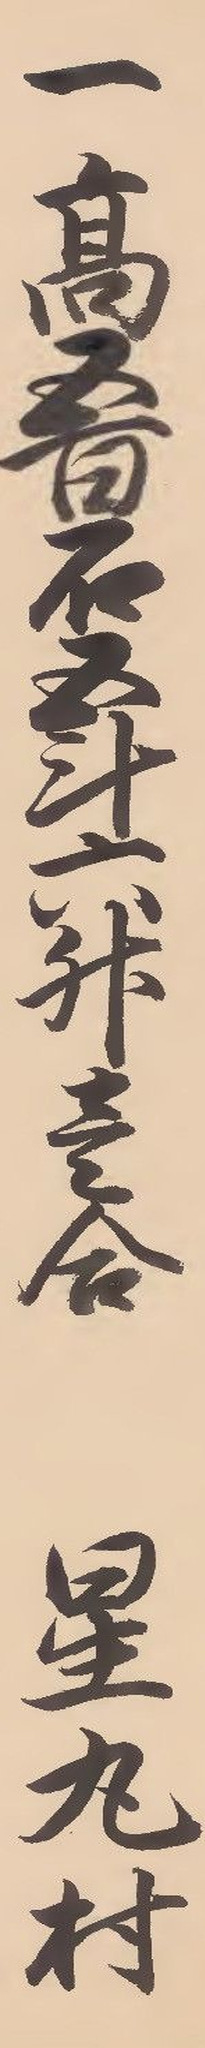一高五百石五斗六升壱合星丸村
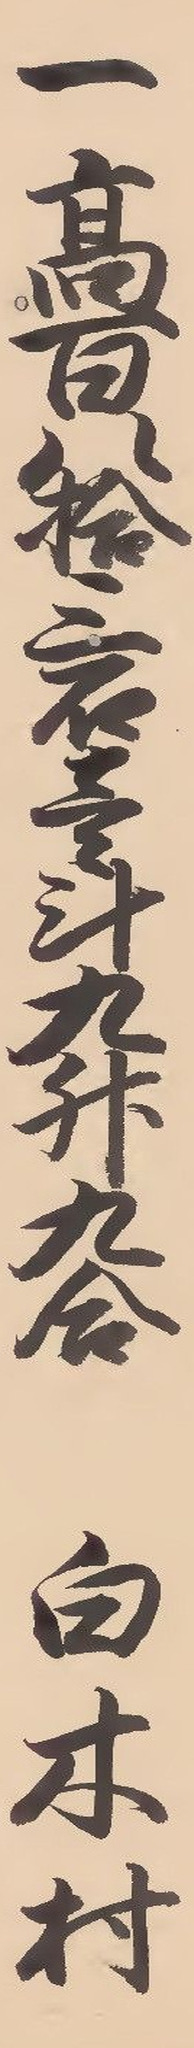一高百八拾三石壱斗九升九合白木村
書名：筑前国郷帳
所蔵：国立公文書館 National Archives of Japan
